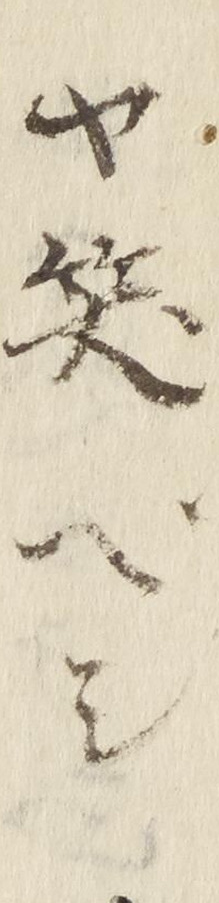ヤ笑ベシ
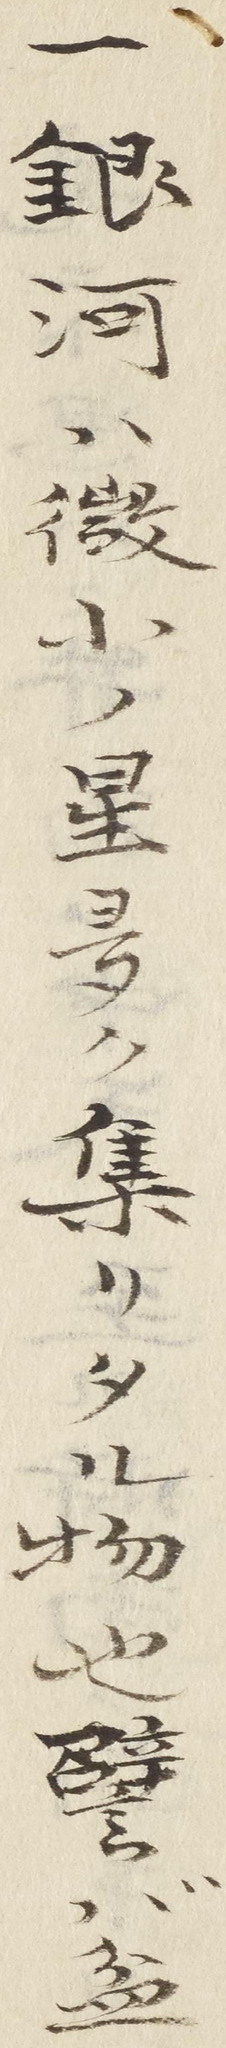一銀河ハ微少ノ星多くク集リタル物也譬ハ盆
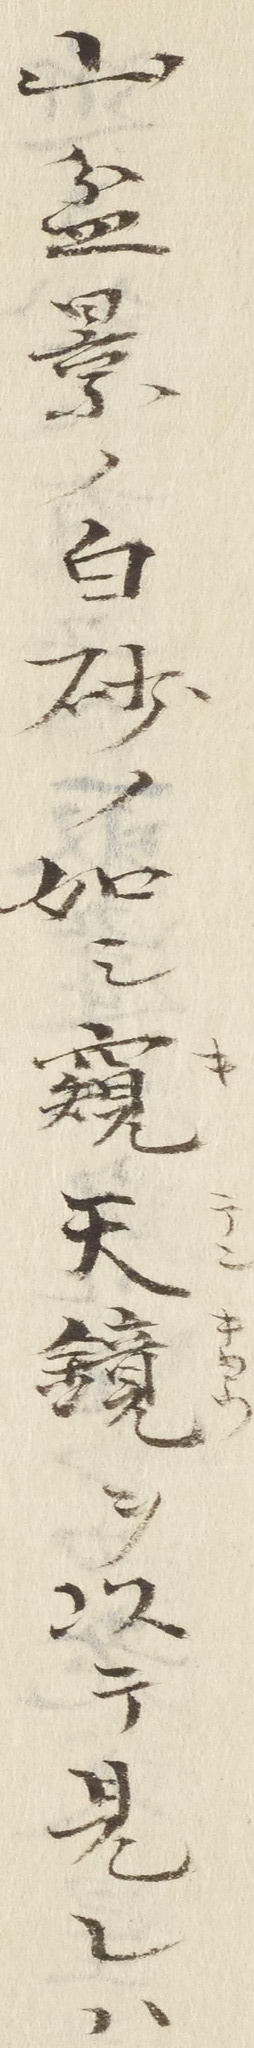山盆景ノ白砂ノ如シ窺天鏡ヲ以テ見レハ
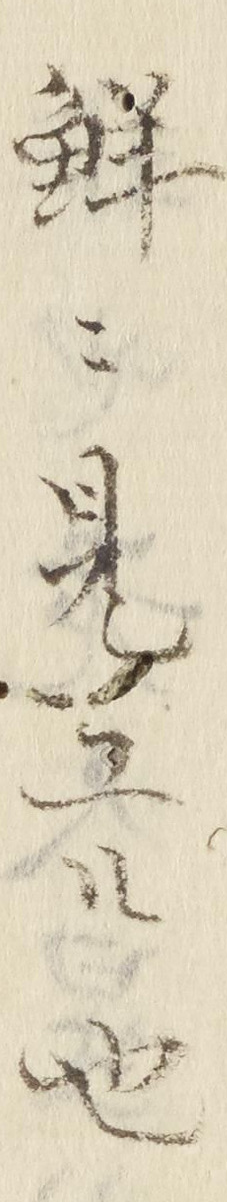鮮ニ見ユル也
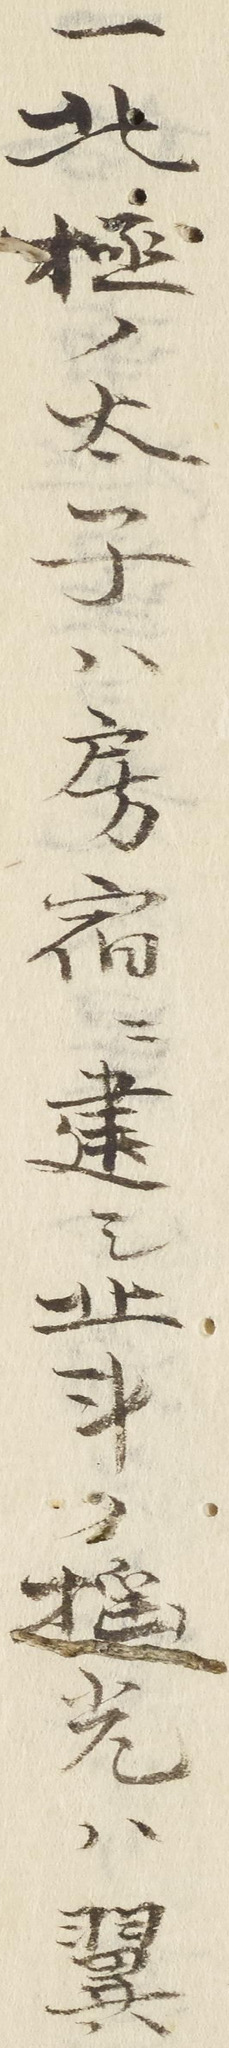一北極ノ太子ハ房宿ニ建シ北斗ノ遥光ハ翼
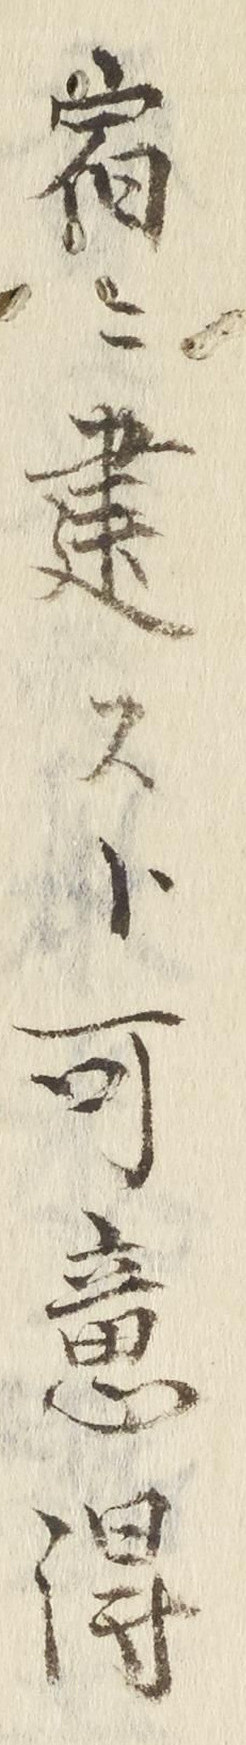宿ニ建スト可意得
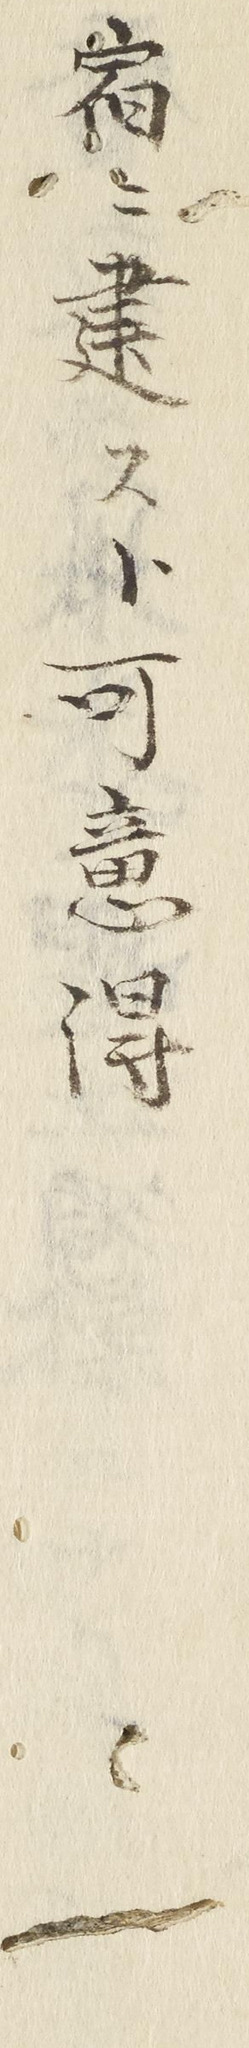宿ニ建スト可意得
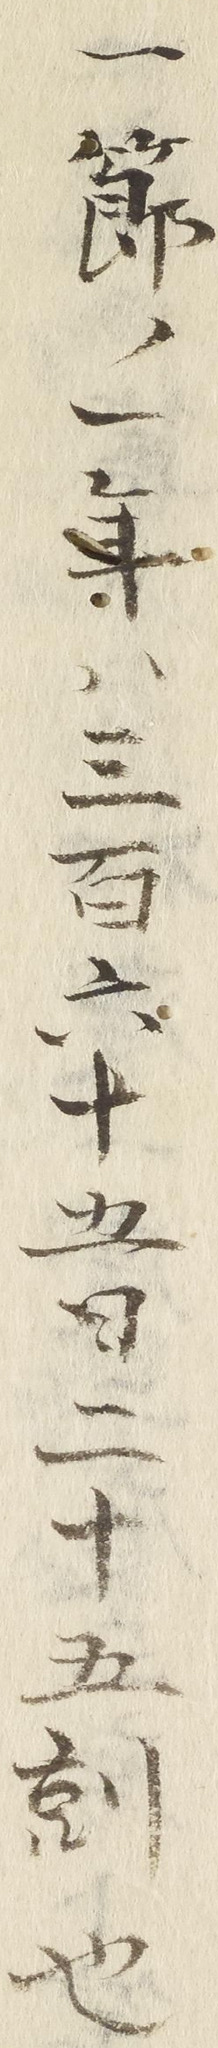一節ノ一年ハ三百六十五日二十五剋也
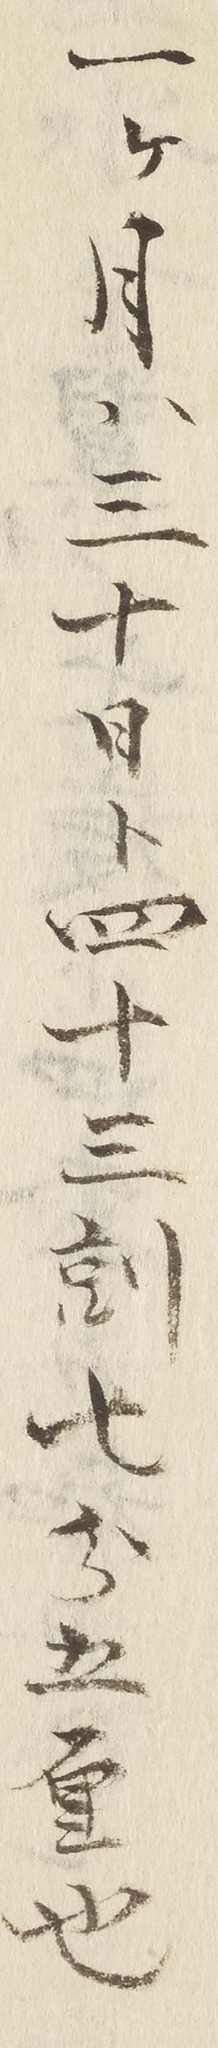一ヶ月ハ三十日ト四十三剋七分五厘也
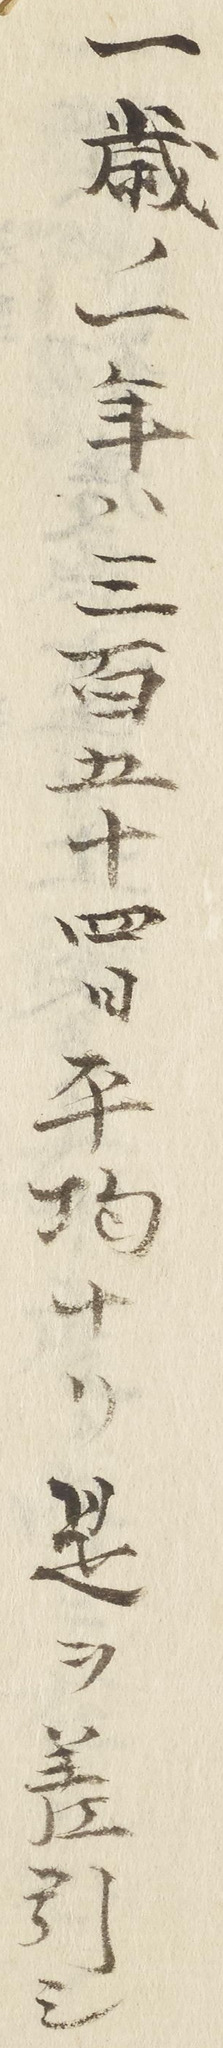一歳ノ一年ハ三百五十四日平均ナリ是ヲ差引シ
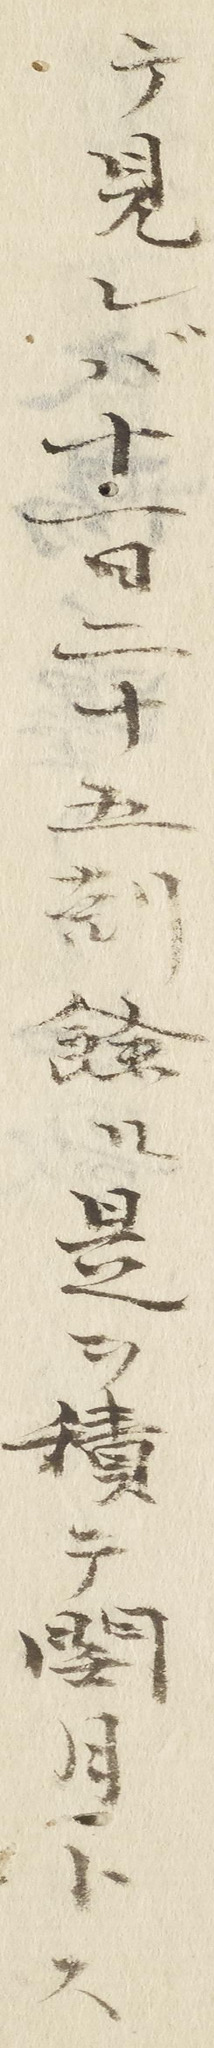テ見レバ十一日二十五剋余ル是ヲ積テ閏月トス
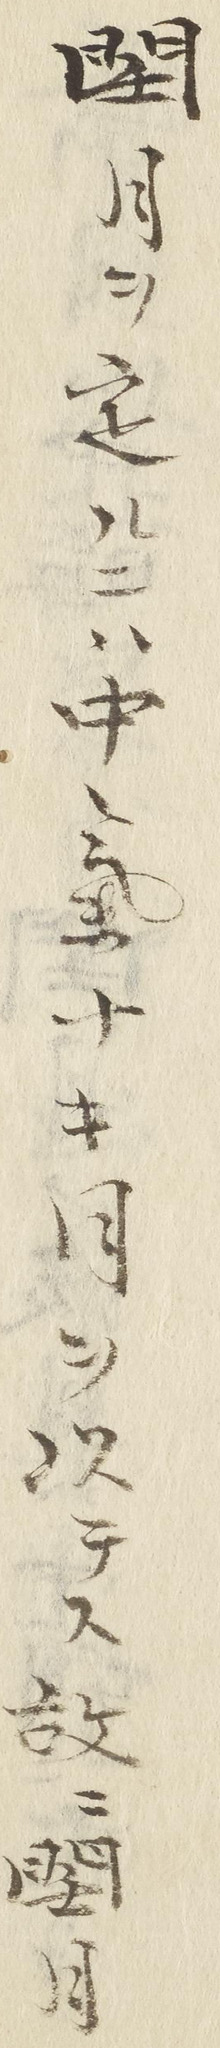閏月ヲ定ルニハ中気小キ月ヲ以テス故ニ閏月

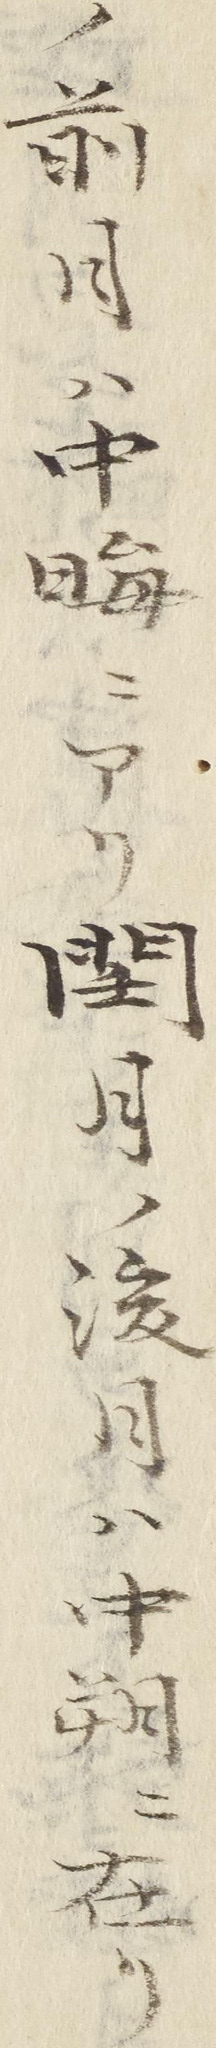ノ前月ハ中晦ニアリ閏月ノ後月ハ中朔ニ在リ
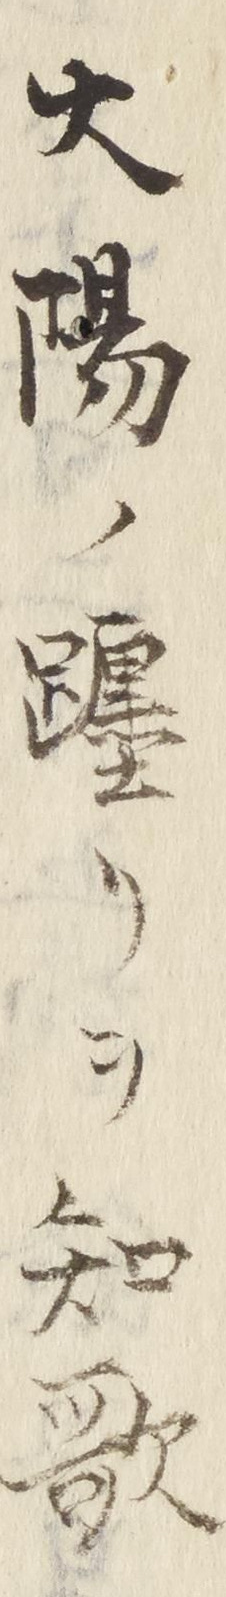大陽ノ躔リヲ知歌
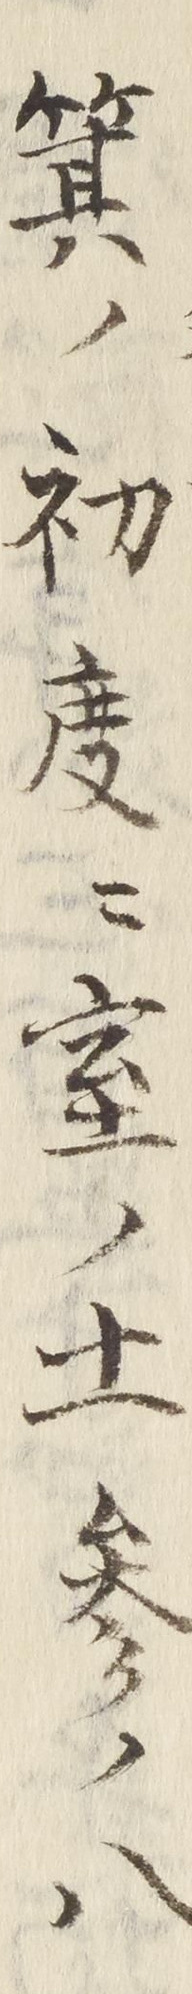箕ノ初度ニ室ノ十一参ノ八
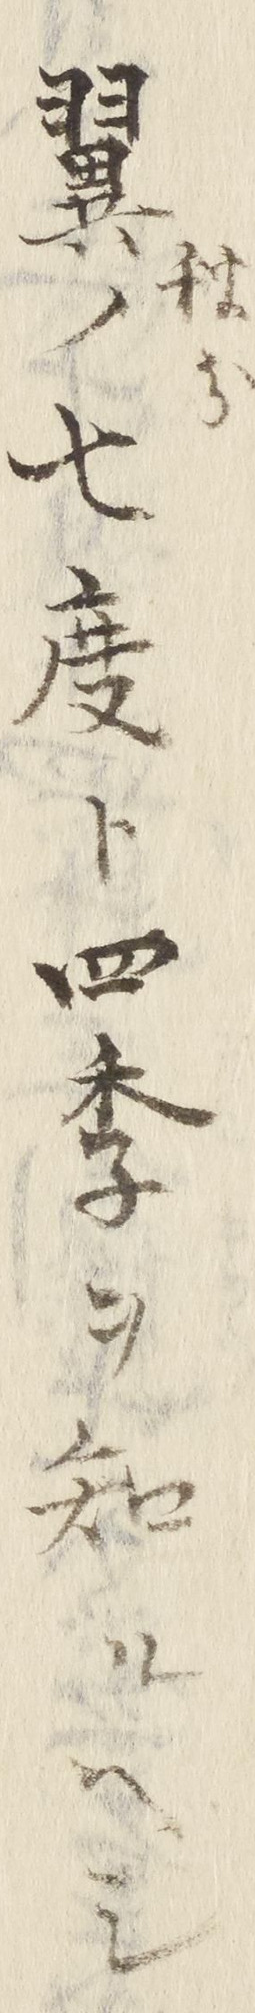翼ノ七度ト四季ヲ知ルヘシ
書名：天象話説
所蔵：東京大学地震研究所図書室 Earthquake Research Institute Library, The University of Tokyo, JAPAN
